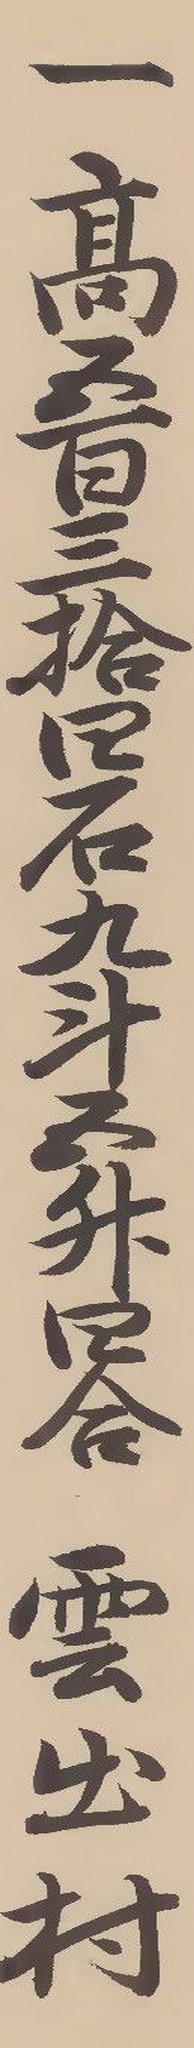一高五百三拾四石九斗五升四合雲出村
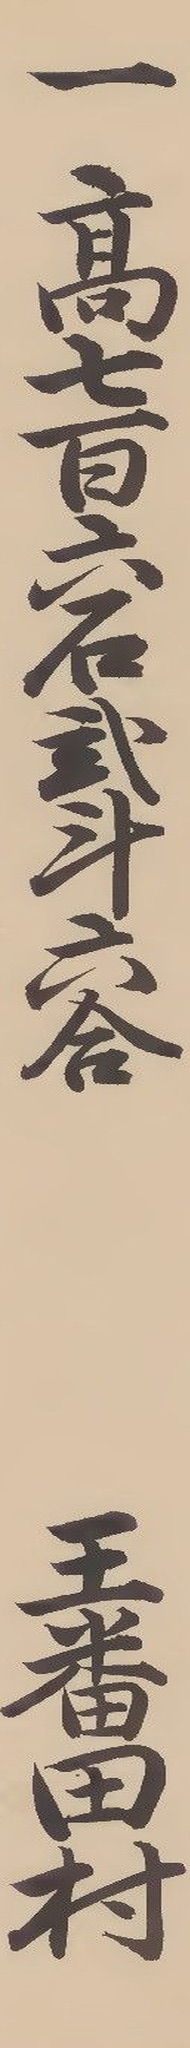一高七百六石弐斗六合王番田村
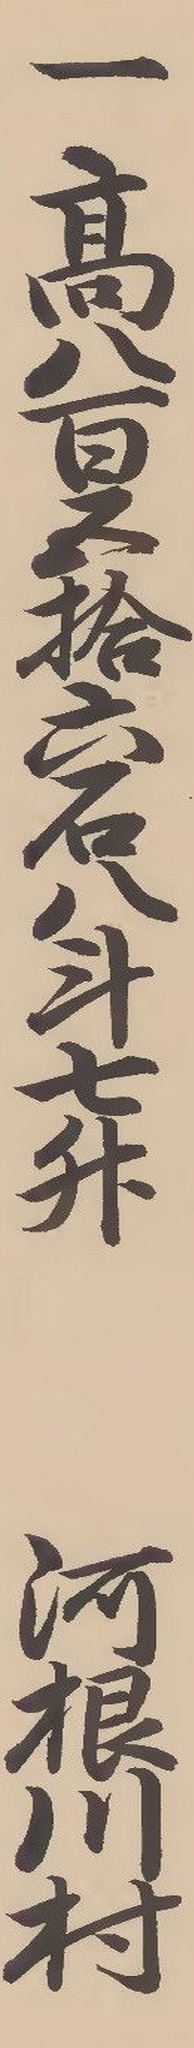一高八百五拾六石八斗七升河根川村
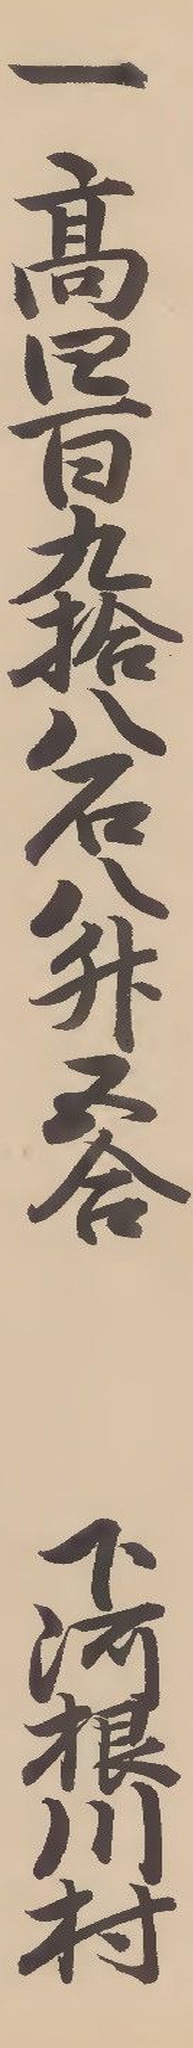一高四百九拾八石八升五合下河根川村
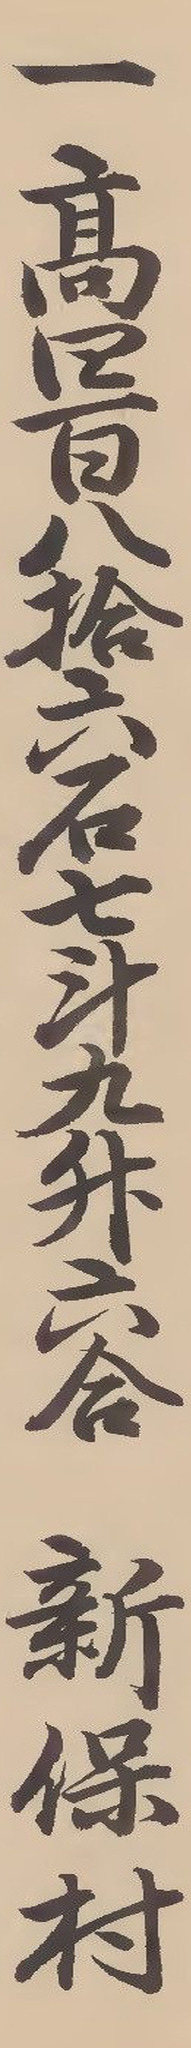一高四百八拾六石七斗九升六合新保村
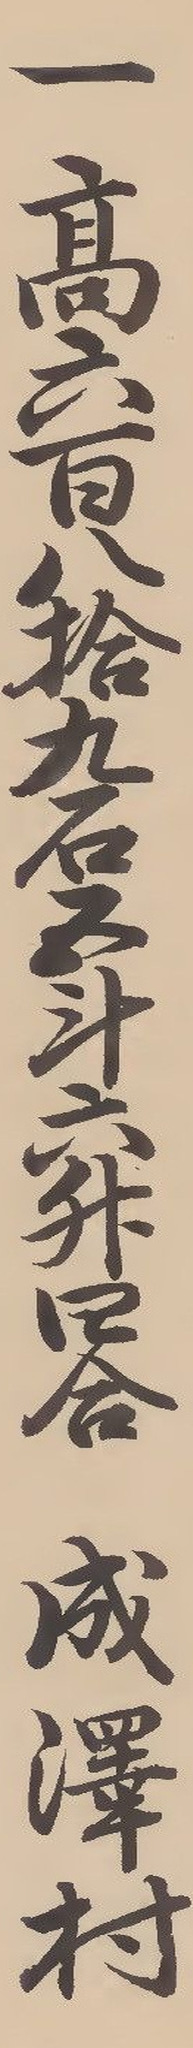一高六百八拾九石五斗六升四合成沢村
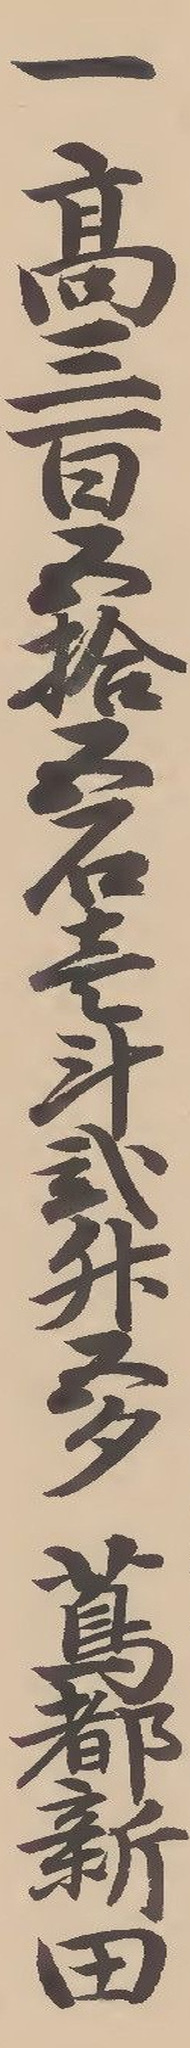一高三百五拾五石壱斗弐升五勺蔦都新田

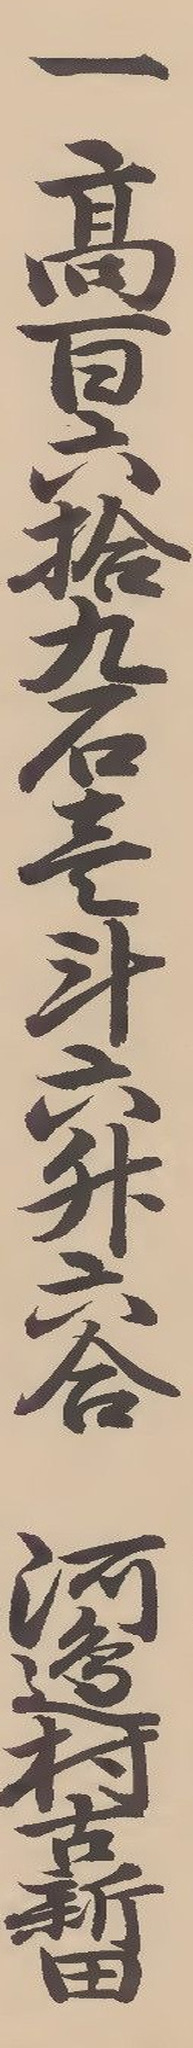一高百六拾九石壱斗六升六合河辺村古新田
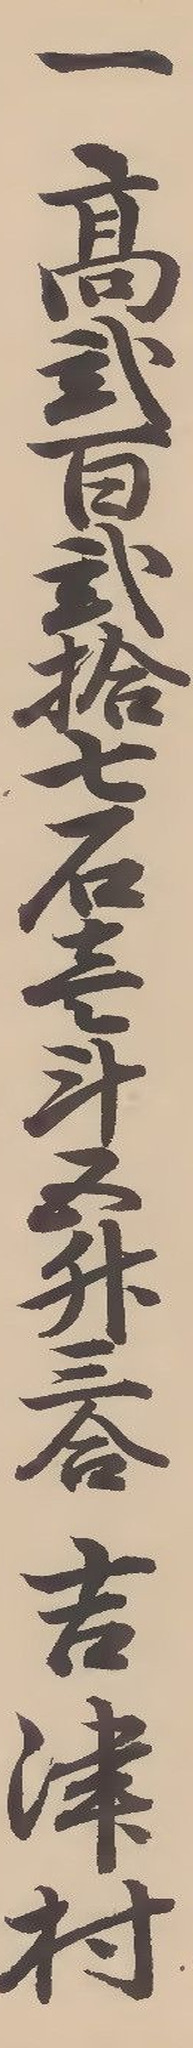一高弐百弐拾七石壱斗五升三合吉津村
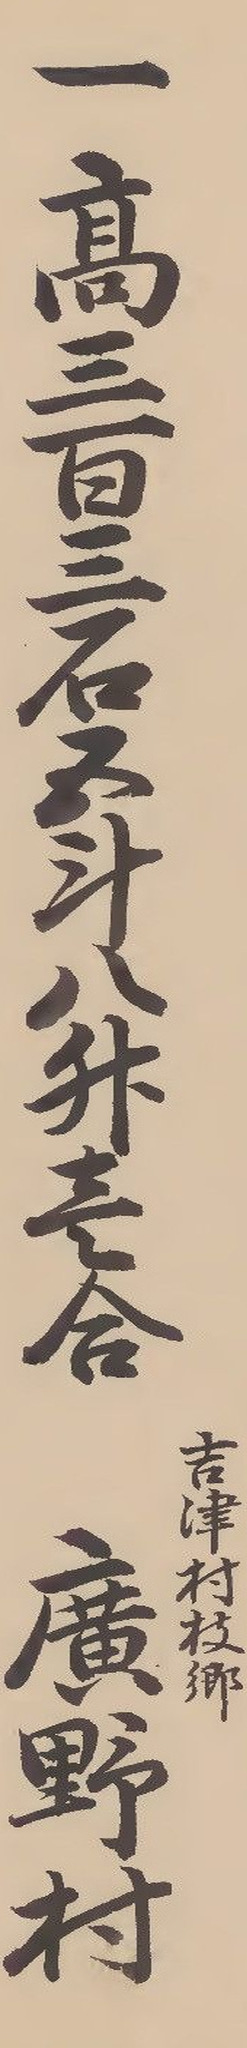一高三百三石五斗八升壱合広野村
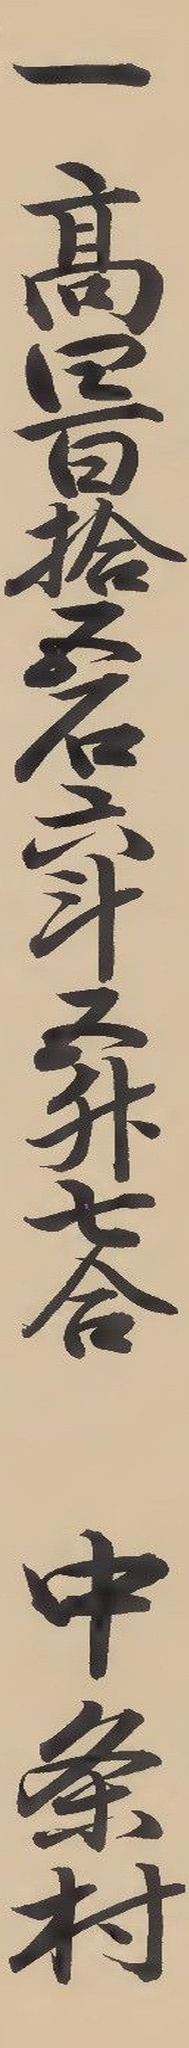一高四百拾五石六斗五升七合中条村
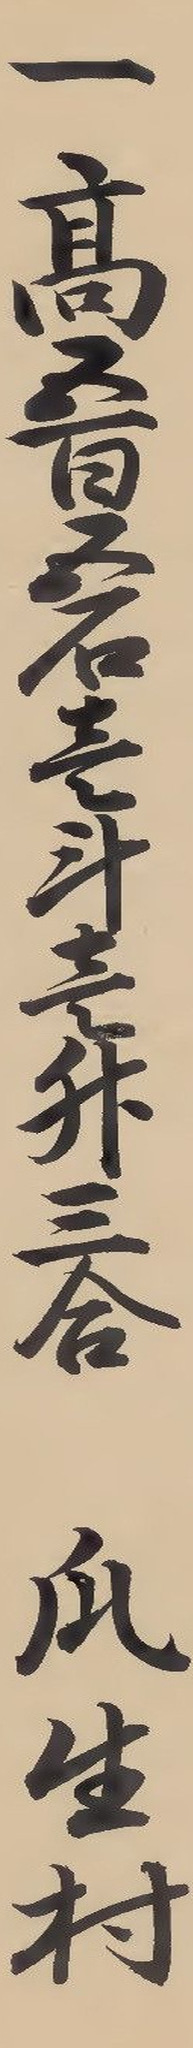一高五百五石壱斗壱升三合瓜生村
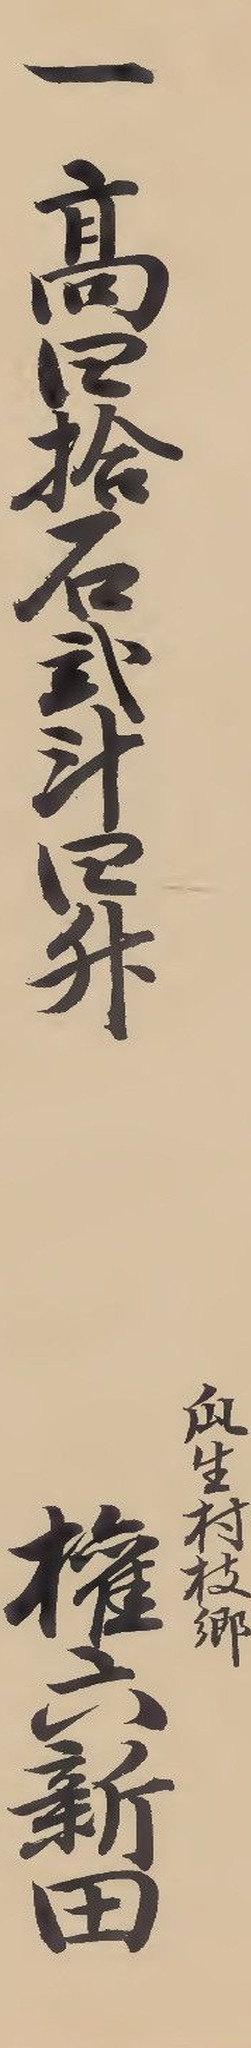一高四拾石弐斗四升権六新田
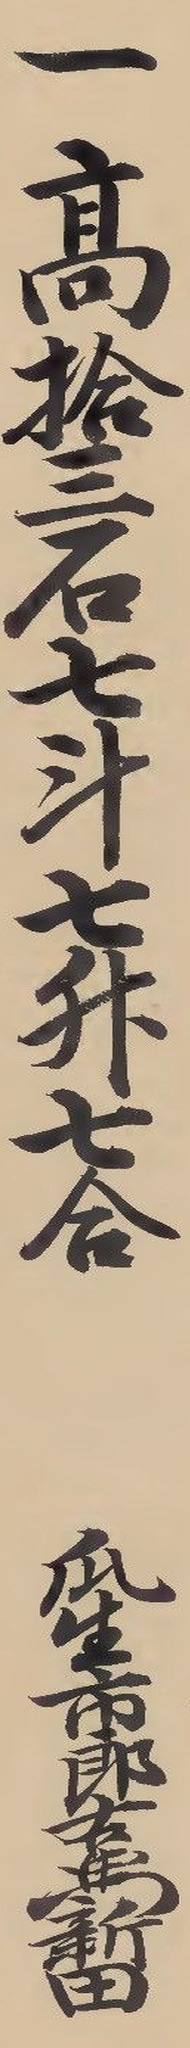一高拾三石七斗七升七合瓜生市郎右衛門新田

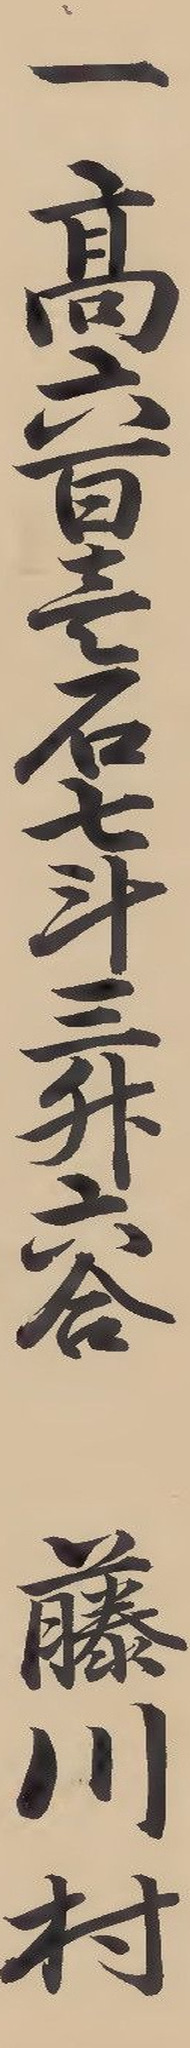一高六百壱石七斗三升六合藤川村
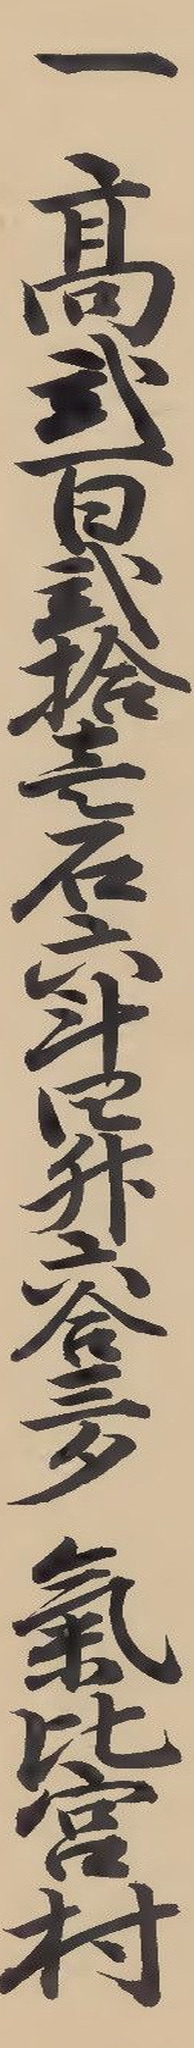一高弐百弐拾壱石六斗四升六合三勺気比宮村
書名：越後国郷帳　中
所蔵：国立公文書館 National Archives of Japan
